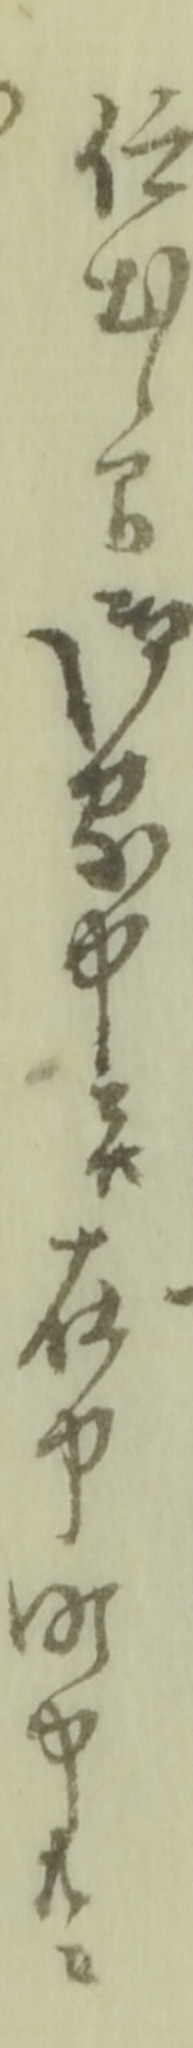仰出候間御家中並在中町中並二
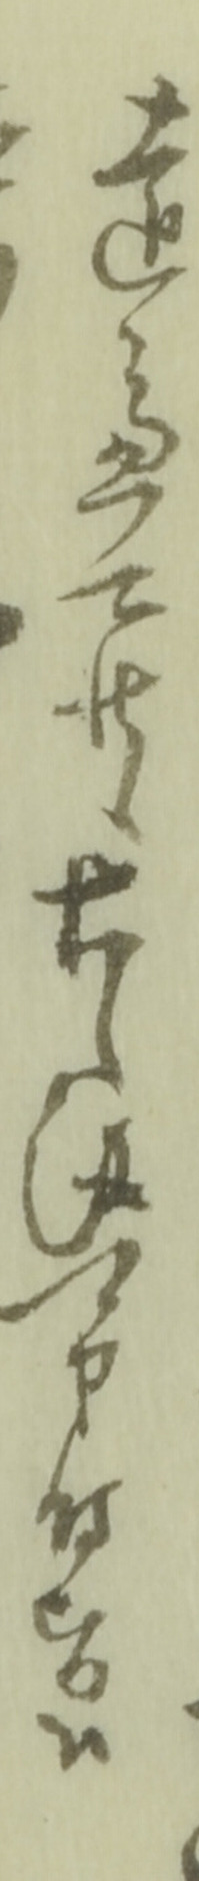遠慮可仕候右之趣可申付旨被
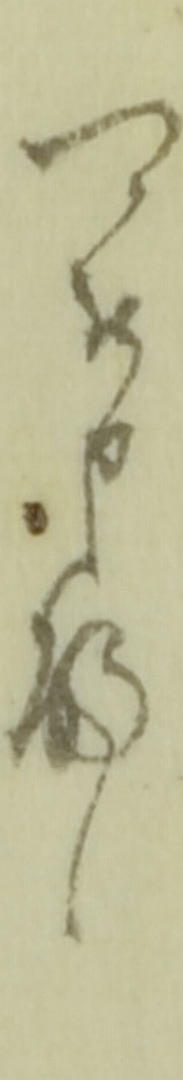可被申触候
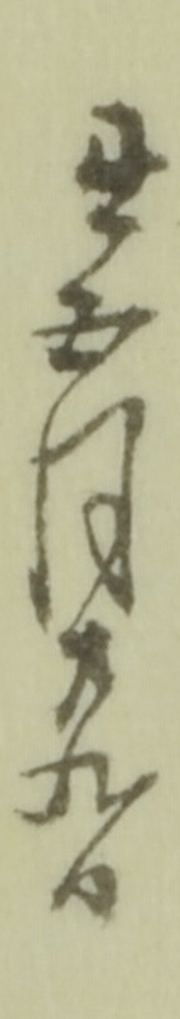丑五月廿九日
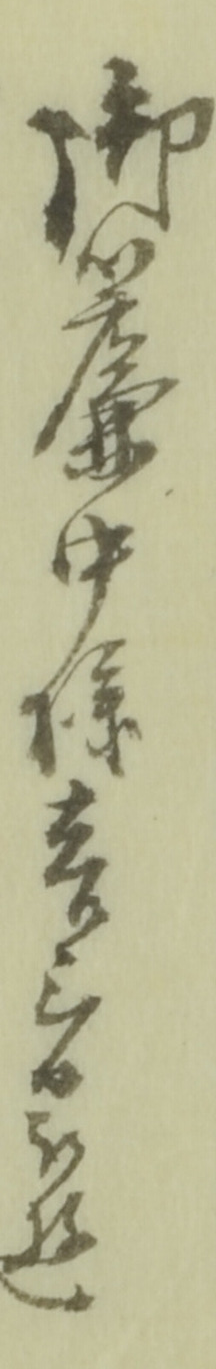御簾中様去三日被遊
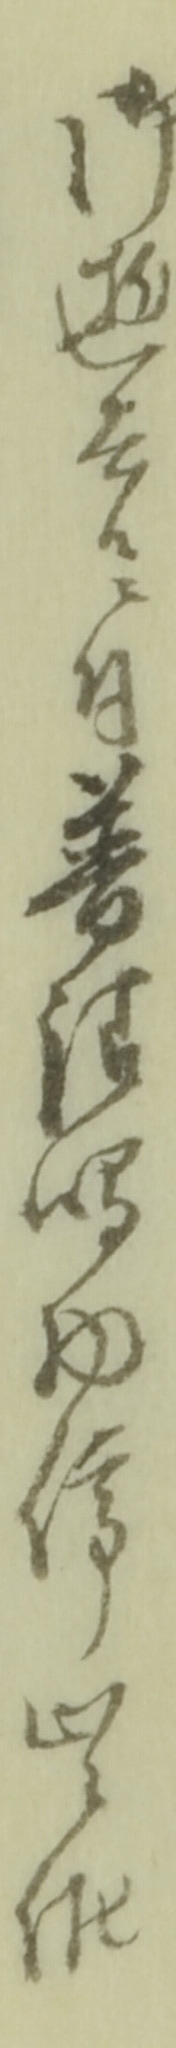御逝去候二付普請鳴物停止候
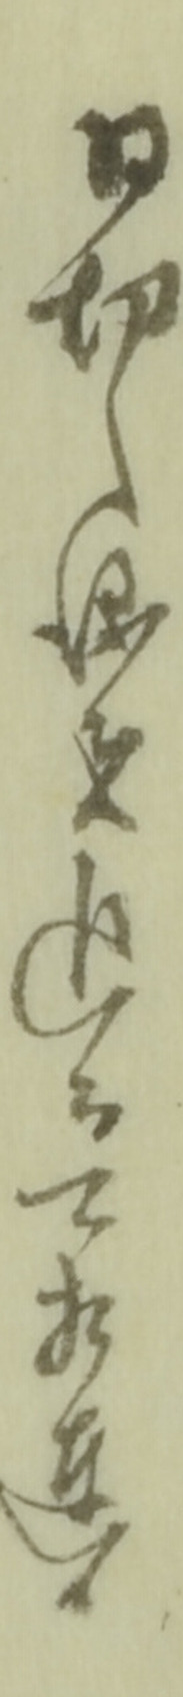日切之儀者追而可相達候
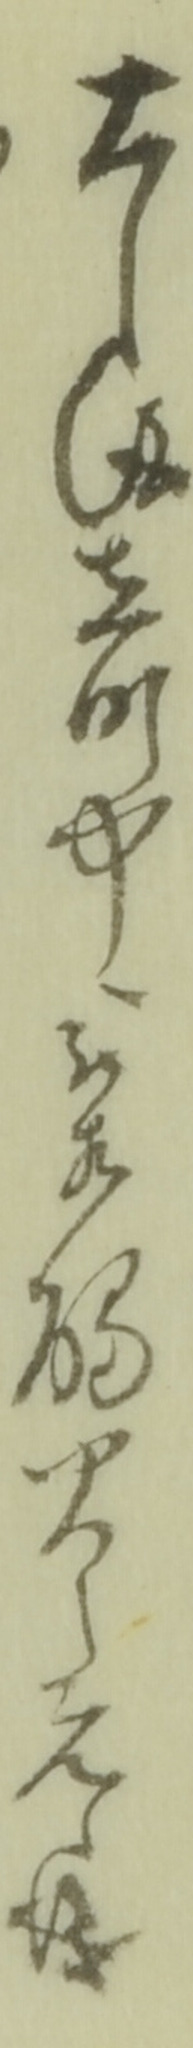右之趣者町中へ相先触火之元之儀
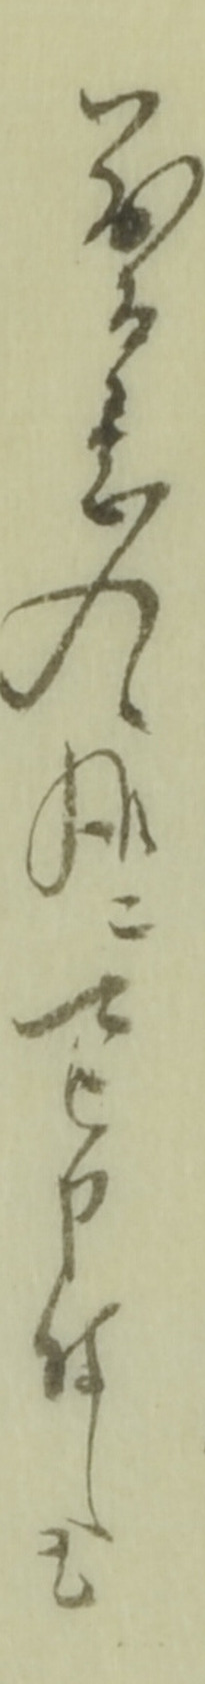兼而念入候様二可被申付候以上
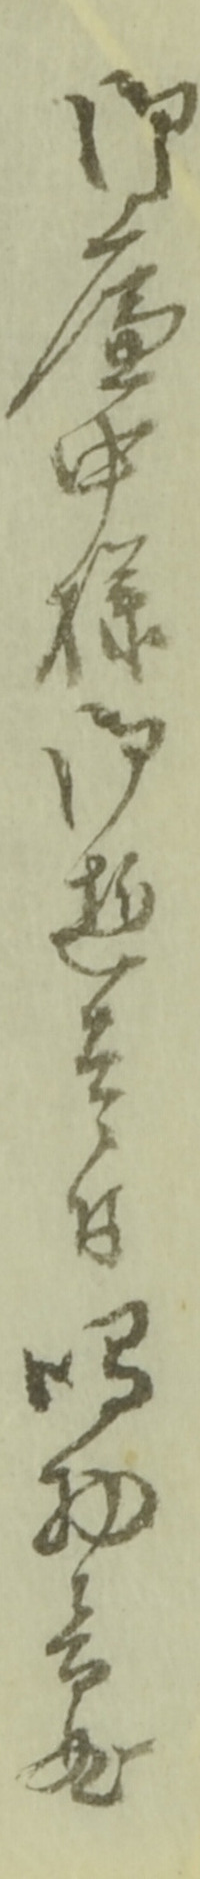御簾中様御逝去二付鳴物二而

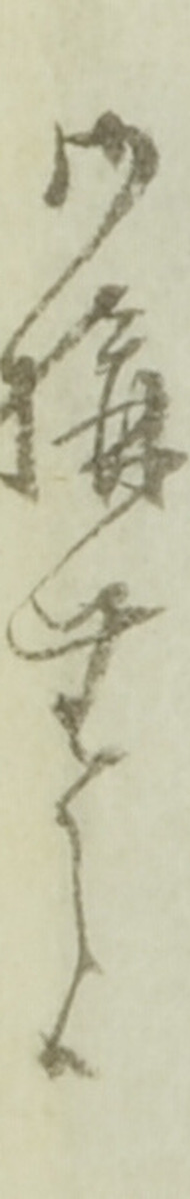御構無之候
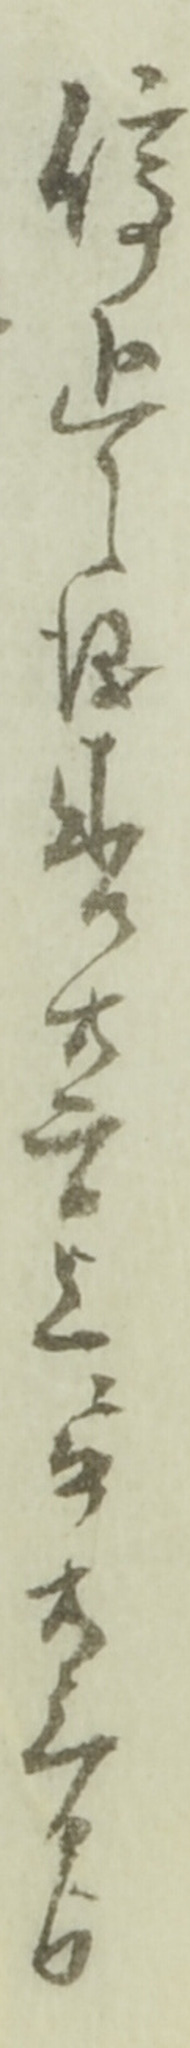停止之儀来候廿二日迄に而廿三日より
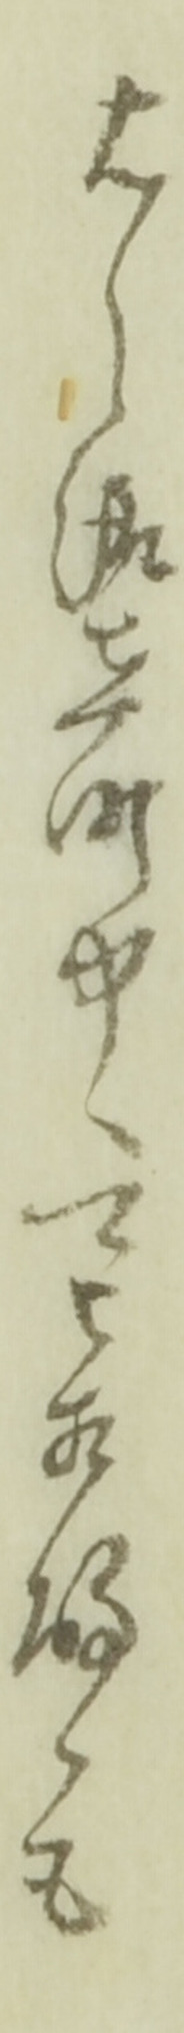右之趣者町中へ可被相触候以上
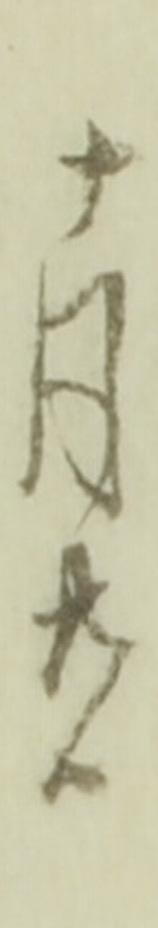十月廿日
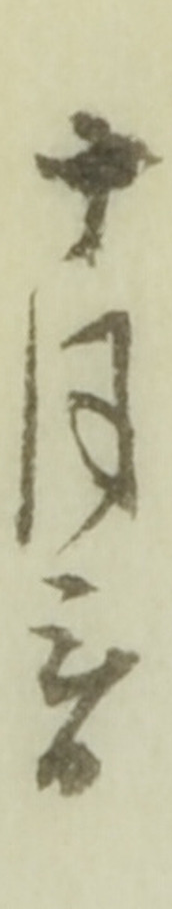十月三日
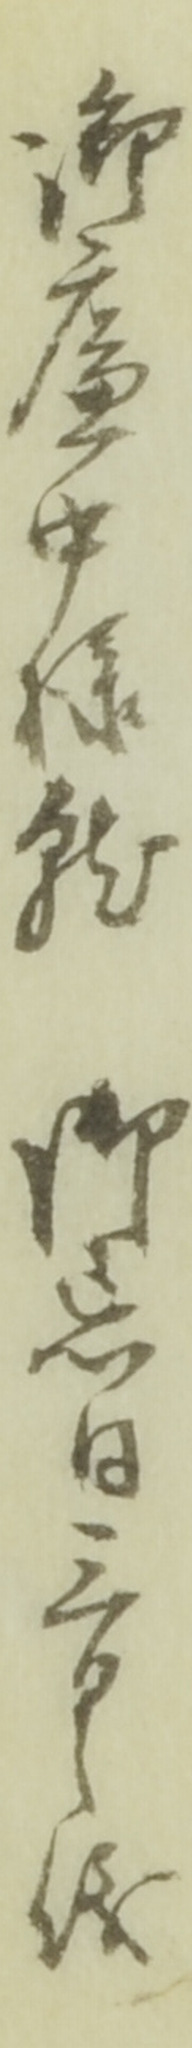御簾中様就御忌日三日候儀
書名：御公儀様御領主様御触書控
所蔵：伊那市立高遠町図書館・合同会社AMANE
